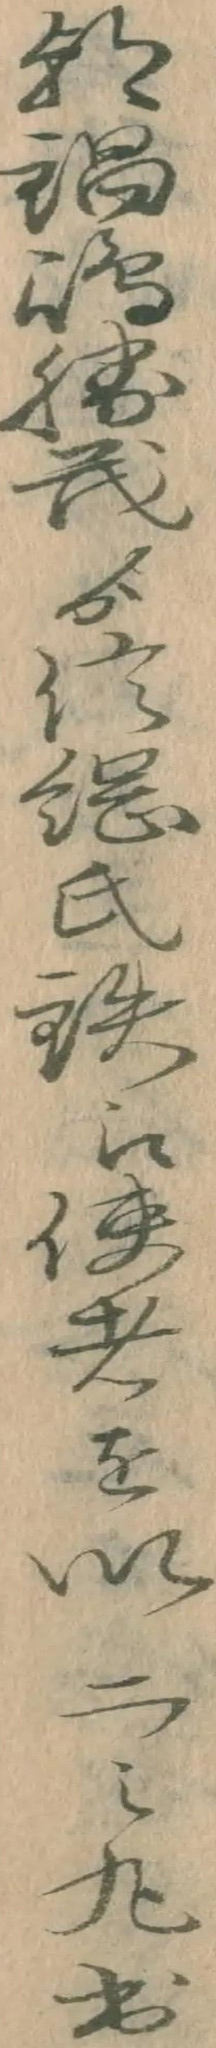朝鍋島勝茂ゟ信綱氏鉄江使者を以二之丸出

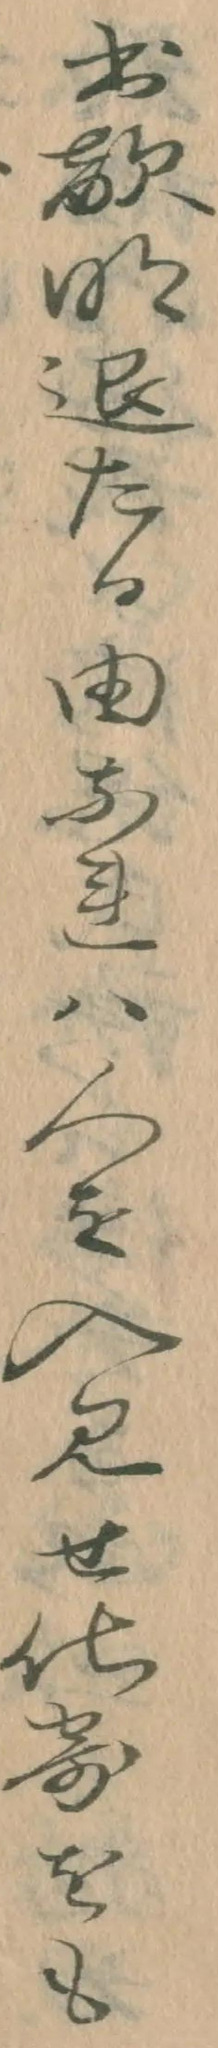出敵明退たる由な連は人を入見せ仕寄をも
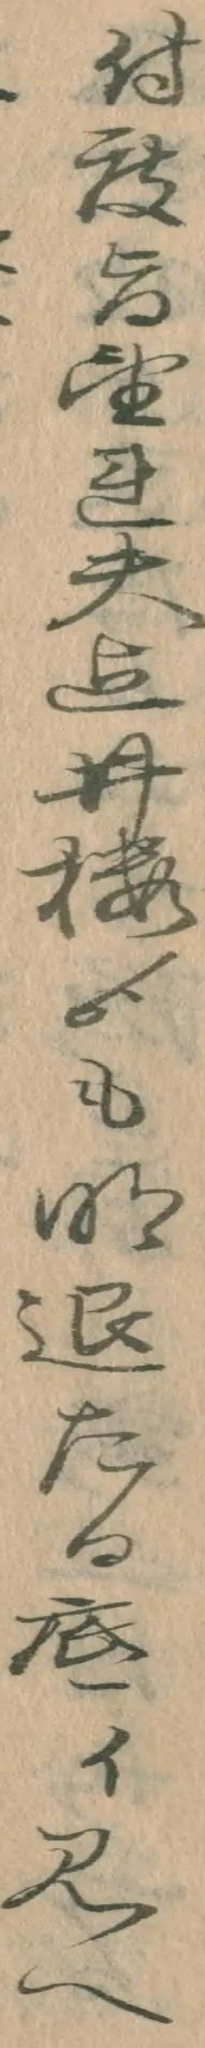付度旨望連夫迄井樓ゟも明退たる底い見へ
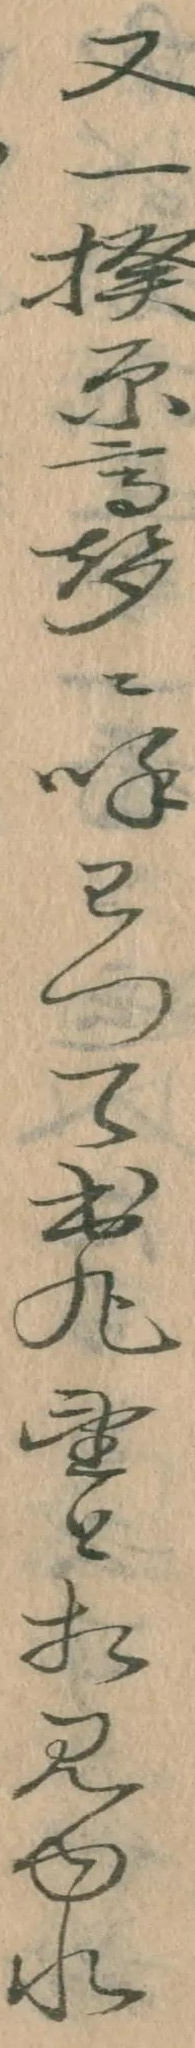又一揆原高声に呼已つて出丸望と相見ゆれ
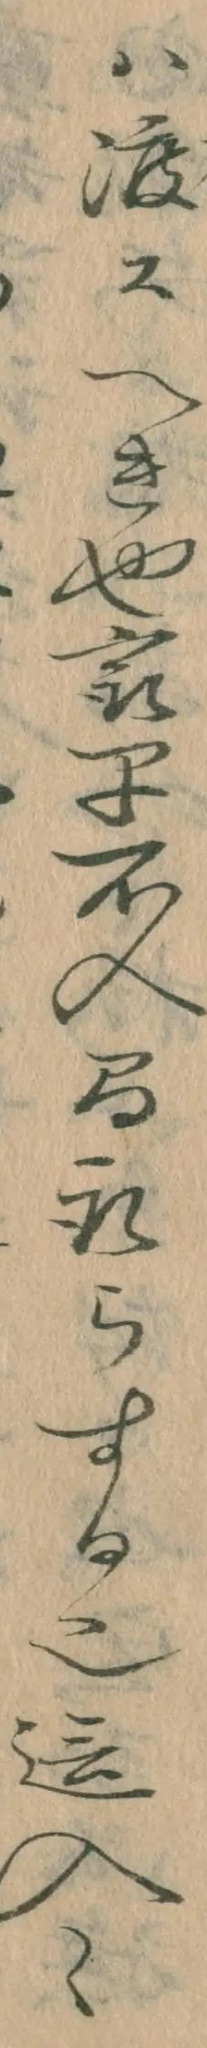は渡すへきや最早不入間取らする也這入々
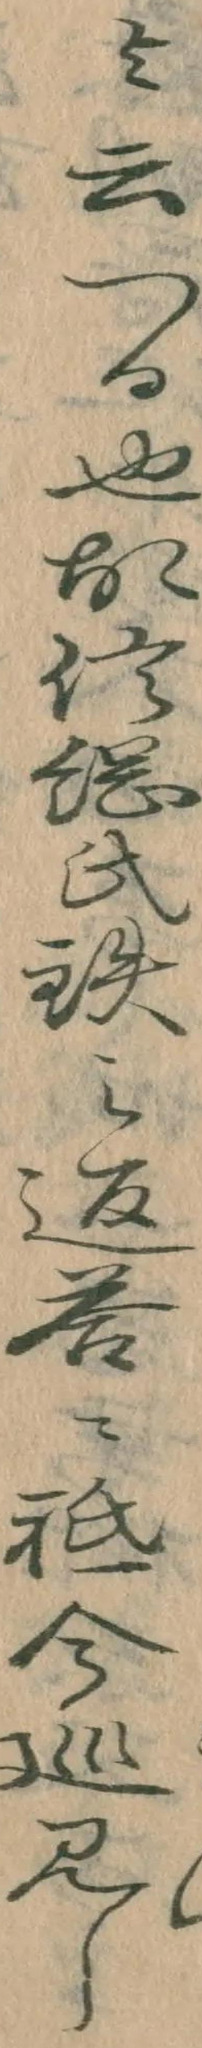与云つる也故信綱氏鉄之返答に祗今巡見し
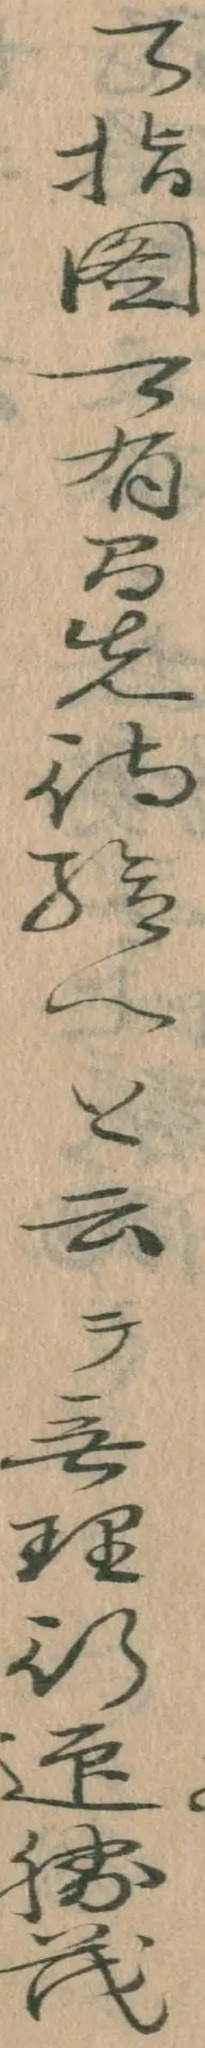て指図可有間先待給へと云て無理行迎勝茂
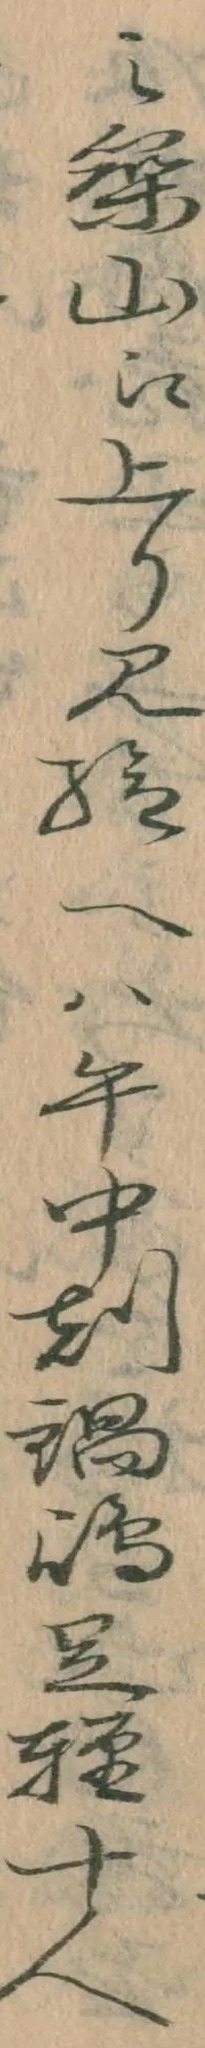之築山江上り見給へは午中刻鍋島足軽十人
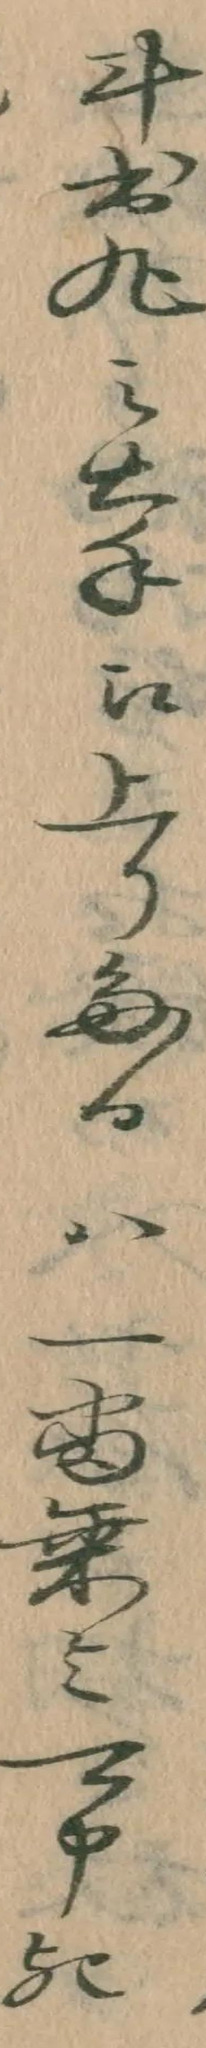斗出丸之土手江上り多るは一番乗与可申歟
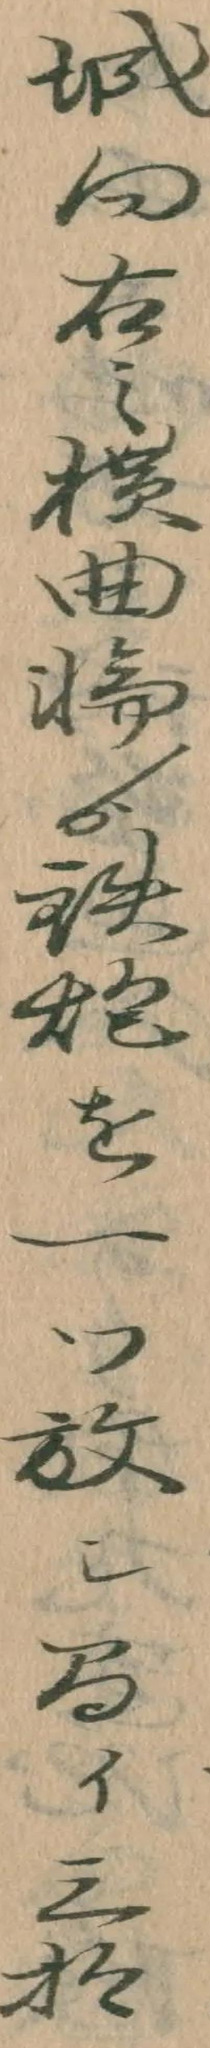城向右之横曲輪ゟ鉄砲を一つ放し間い三拾
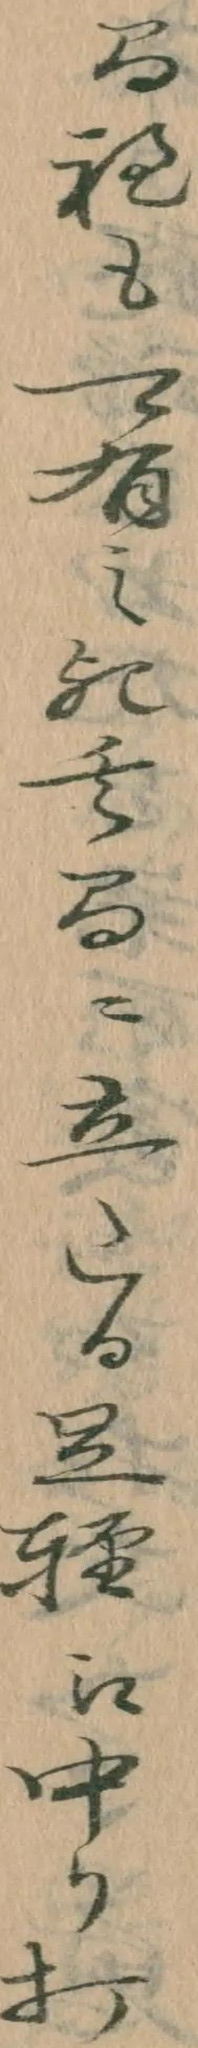間程も可有之歟其間に立たる速軽江中り打
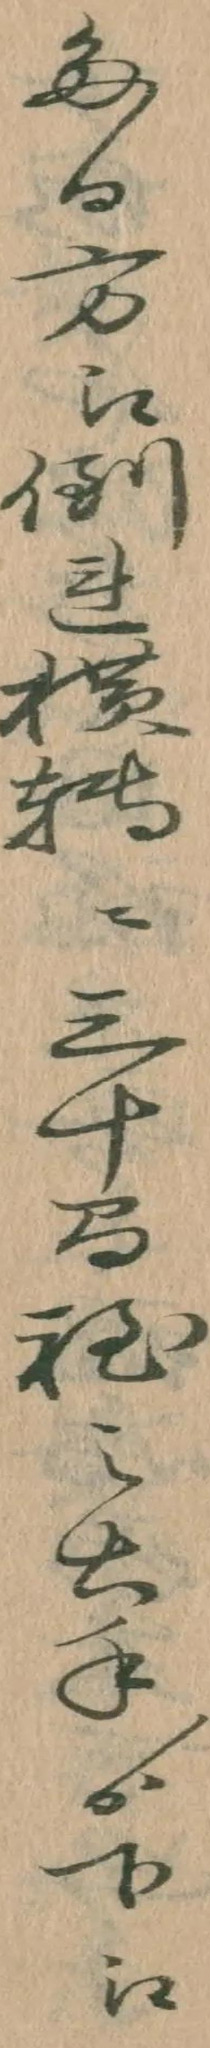多る方江倒連横転に三十間程之土手ゟ下江
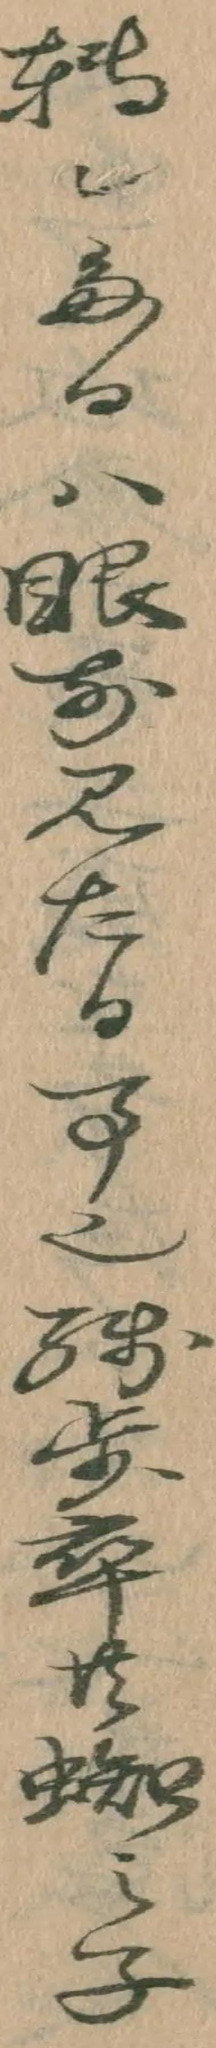転し多るは眼前見たる事也残歩卒共蜘之子
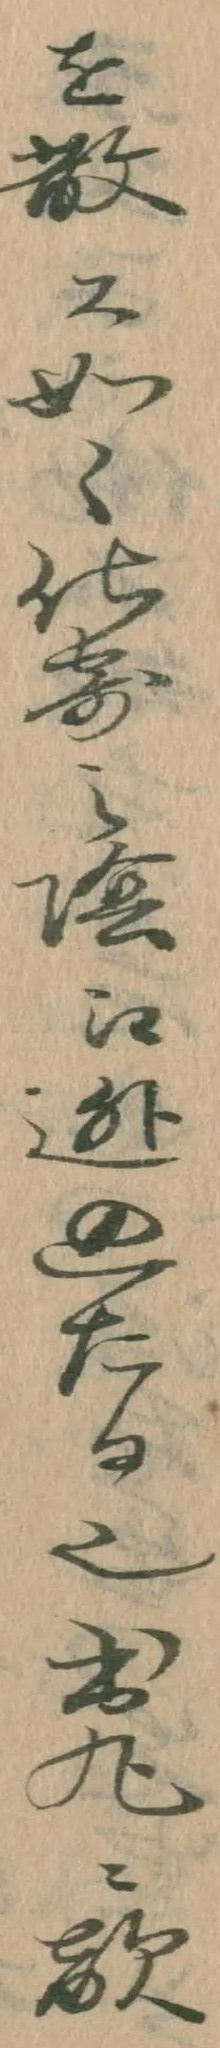を散す如く仕寄之陰江逃込たる也出丸に敵
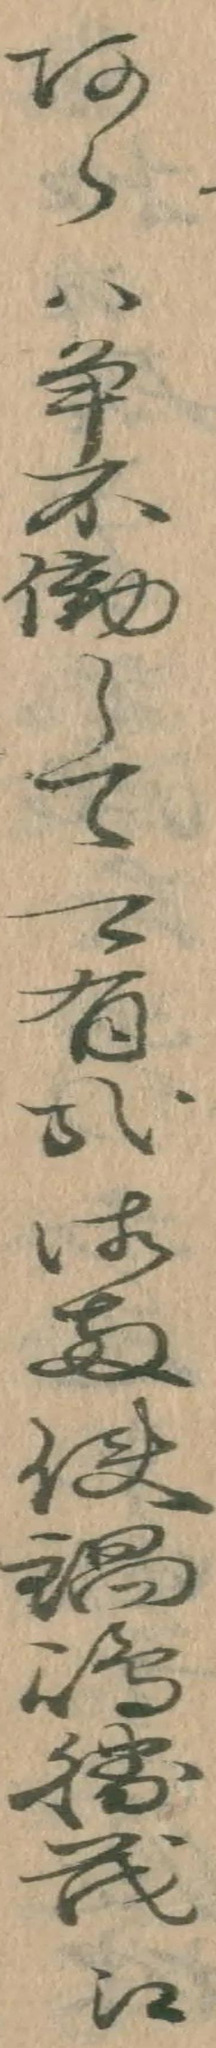阿らは争不働して可有哉御両使鍋島勝茂江
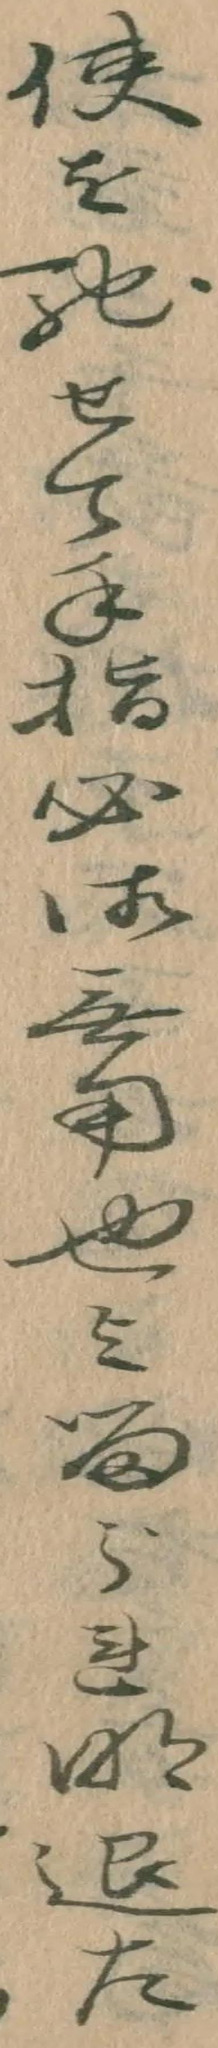使を馳せて手指必御無用也与留ら連明退た
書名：切支丹御退治記 49巻. [7]
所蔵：国立国会図書館 National Diet Library, JAPAN
